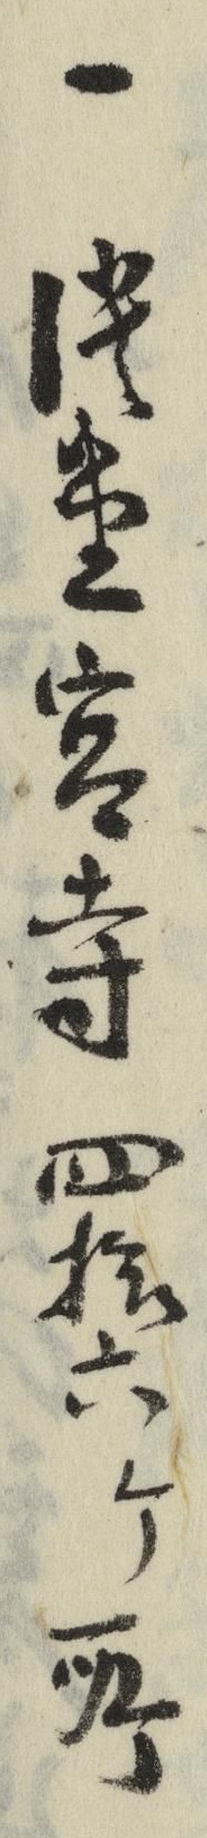一潰堂宮寺四拾六ヶ所
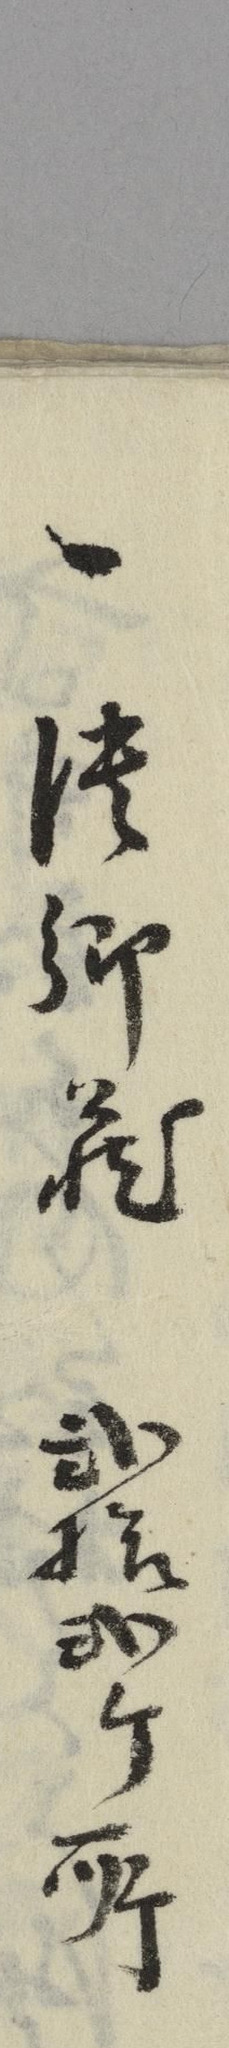一潰郷蔵弐拾弐ヶ所
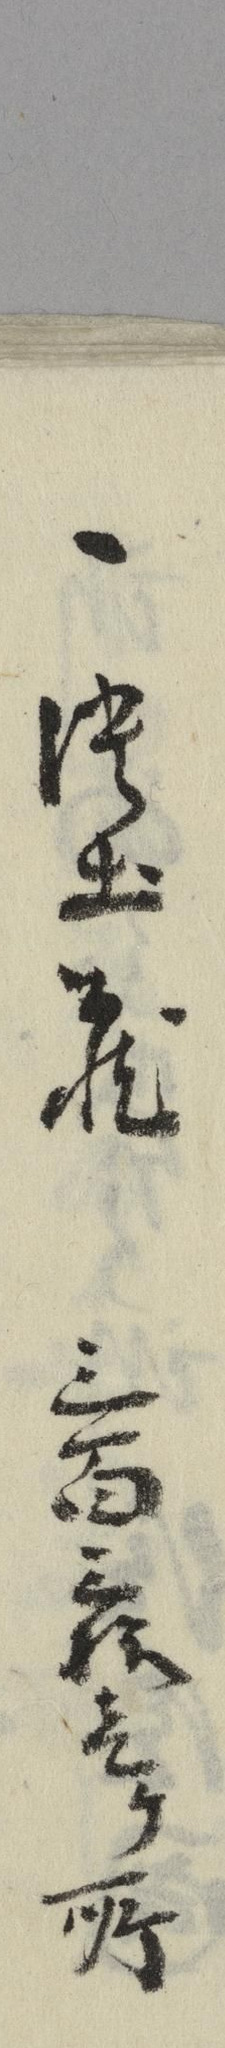一潰土蔵三百三拾壱ヶ所
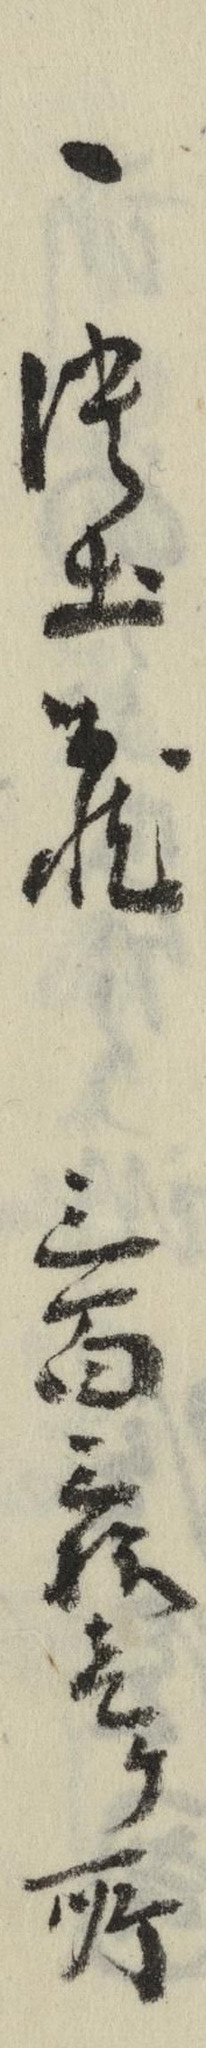一潰土蔵三百三拾壱ヶ所
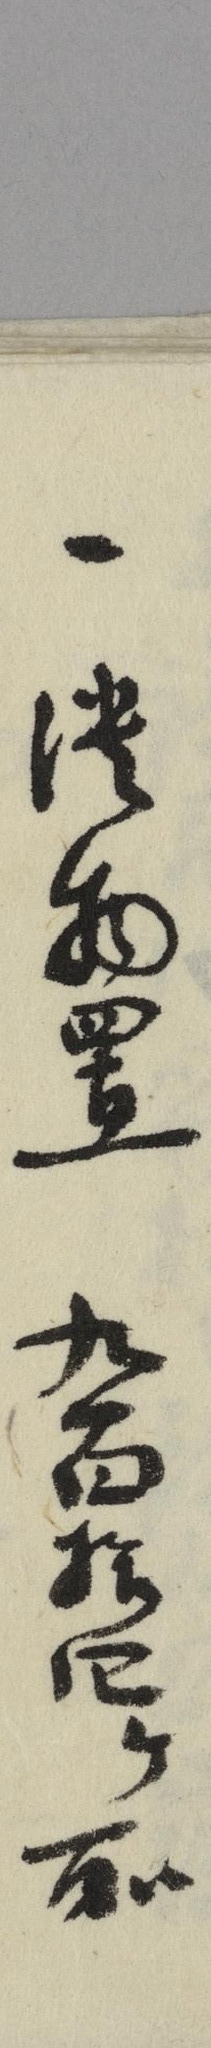一潰物置九百拾四ヶ所
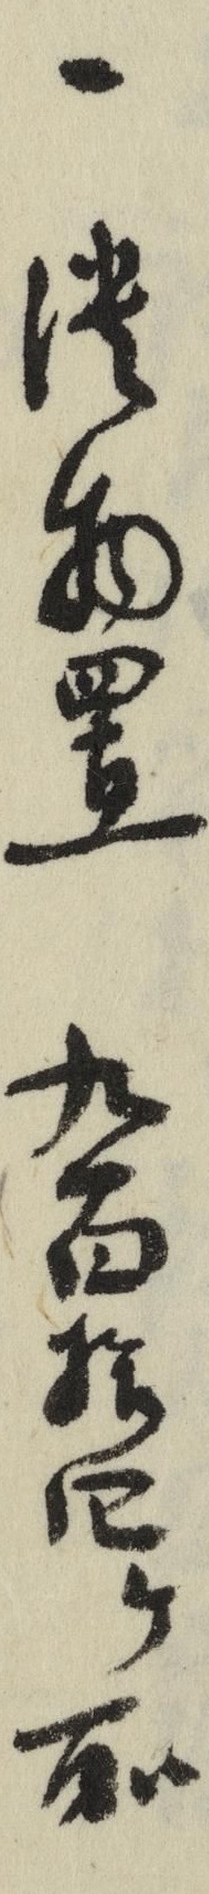一潰物置九百拾四ヶ所
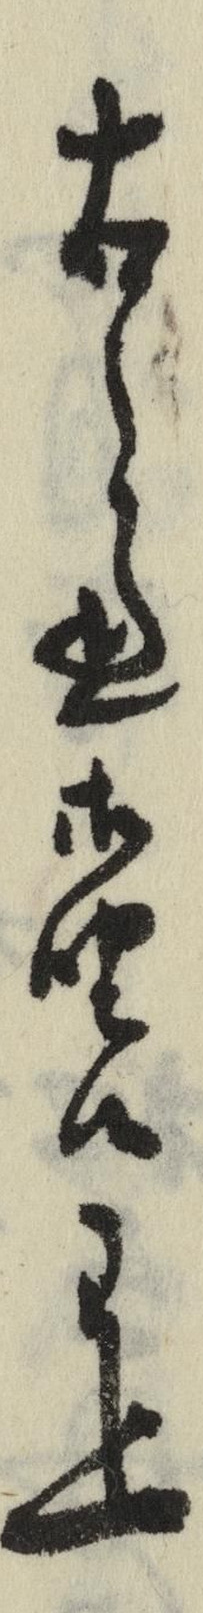右之通御坐候已上
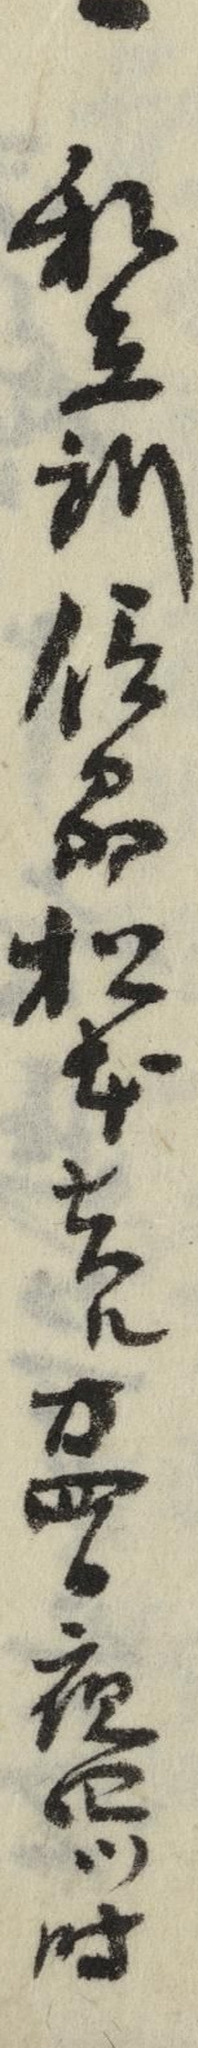一私在所信州松本去ㇽ廿四日夜四ッ時
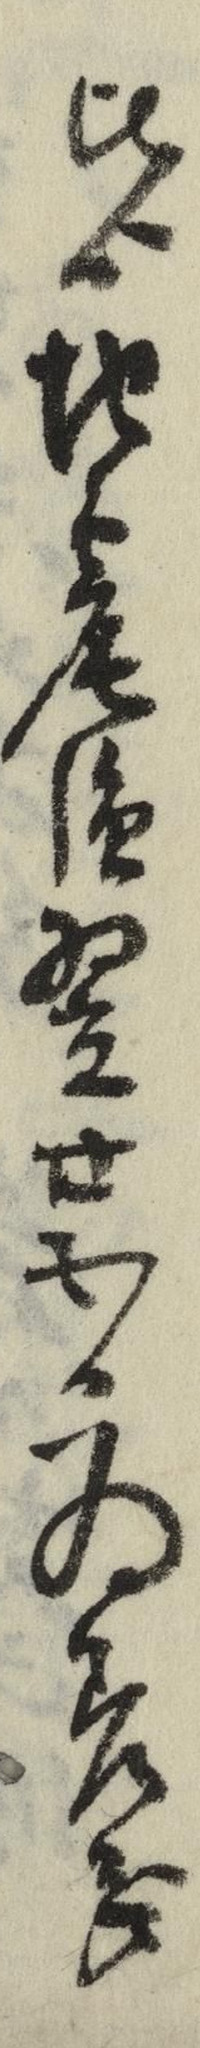比ゟ地震強翌廿五日為差義
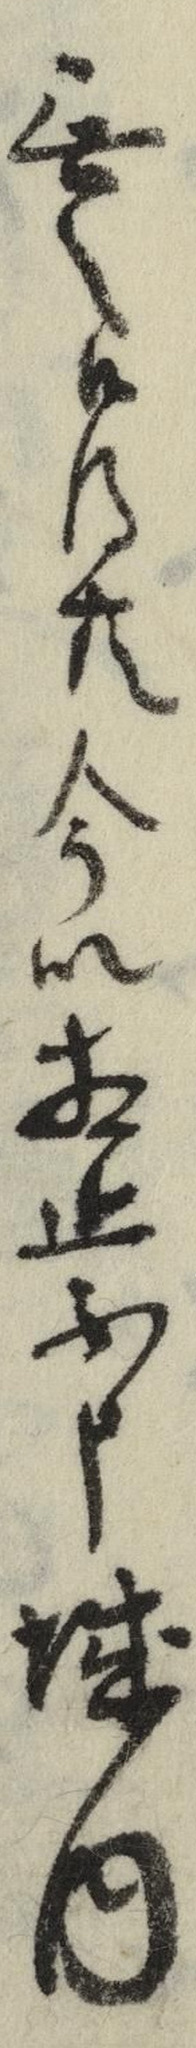無之候得共今以相止不申城内
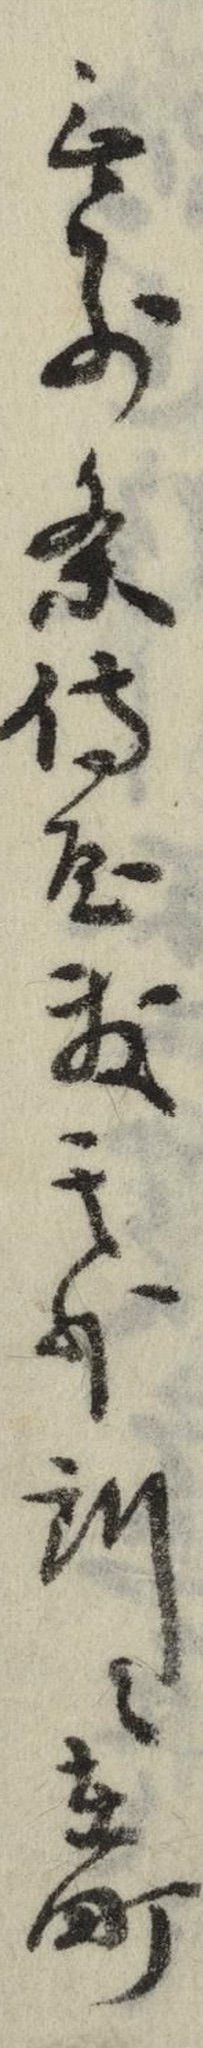無別条侍屋敷其外所々在町

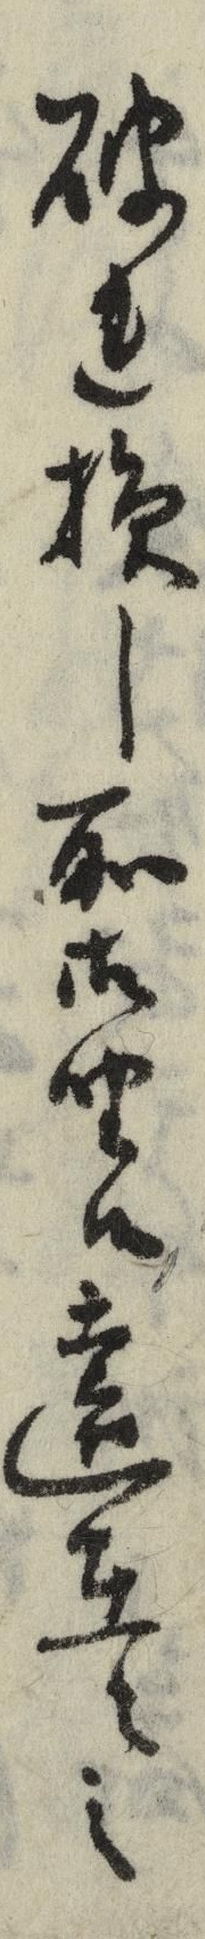破れ損し所御坐候遠在々之
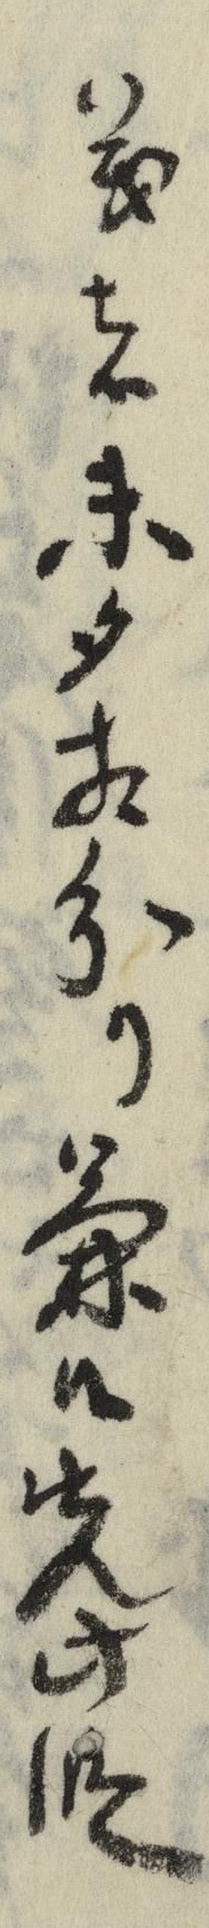義者未タ相分リ兼候先此段
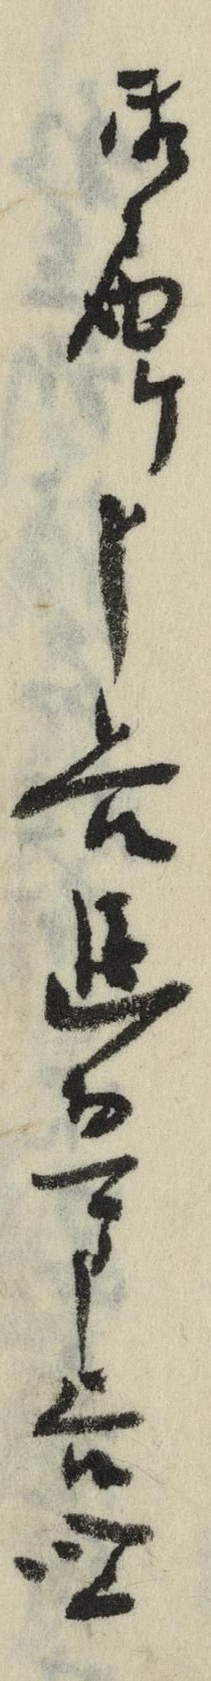御届ヶ申上候追而可申上候以上
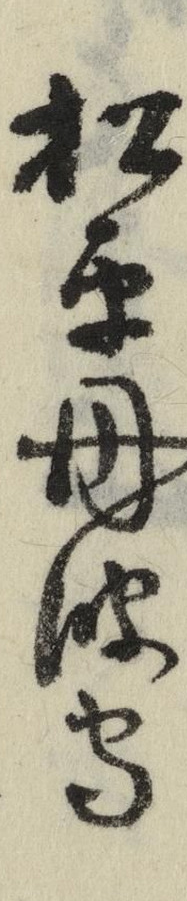松平丹波守
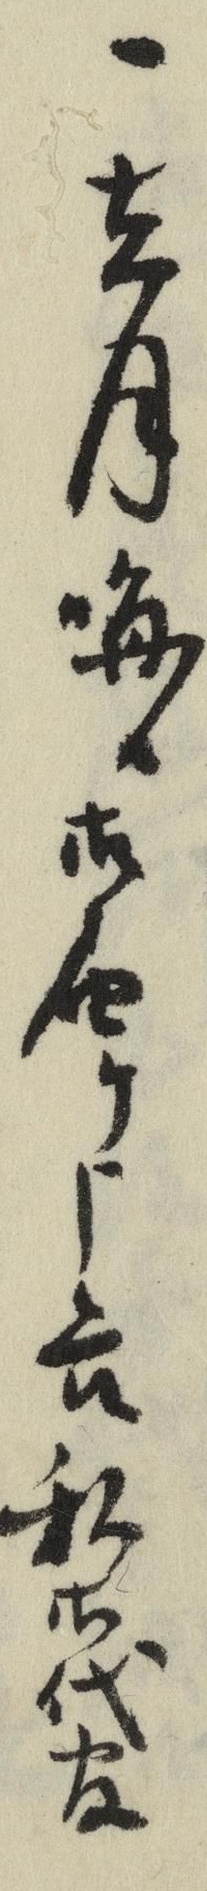一去月晦日御届ケ申上候私御代官
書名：信州大地震一件之冩　丁未弘化四年三月吉日
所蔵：東京大学地震研究所図書室 Earthquake Research Institute Library, The University of Tokyo, JAPAN
